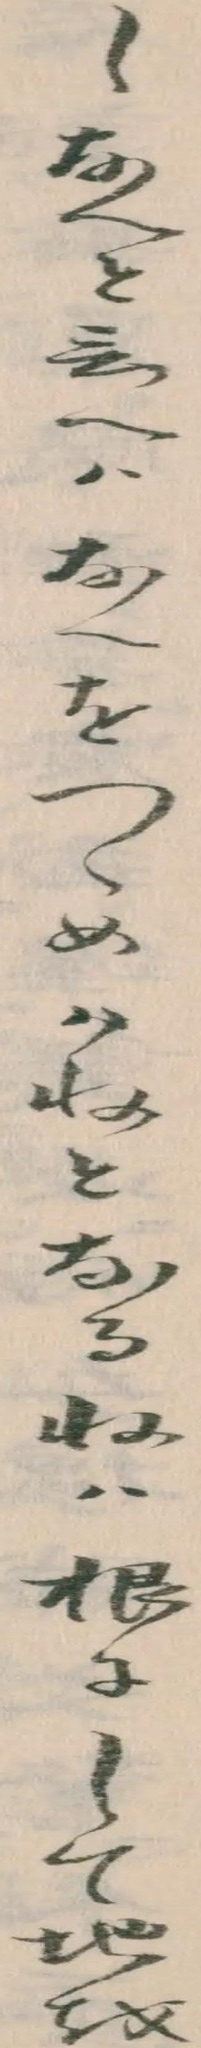しなへと言へはなへをつゝめはねとなるねは根にして地を
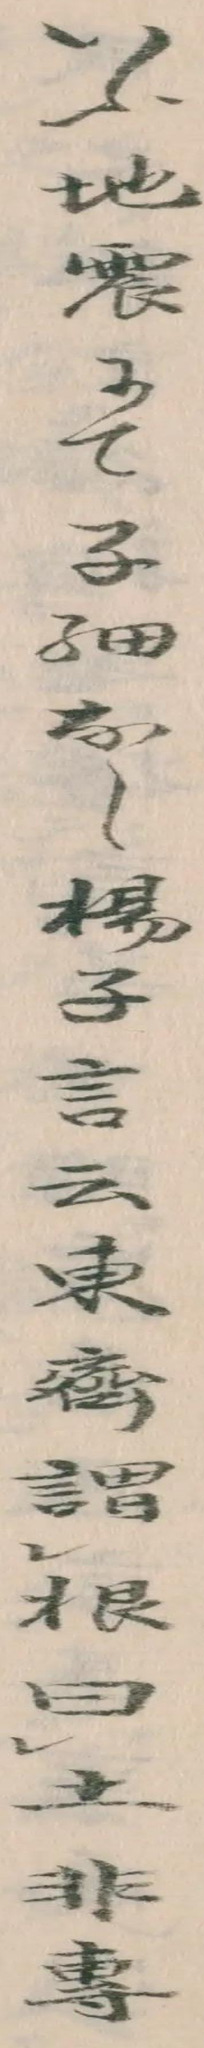いふ地震にて子細なし楊子言云東斉謂根曰土非専
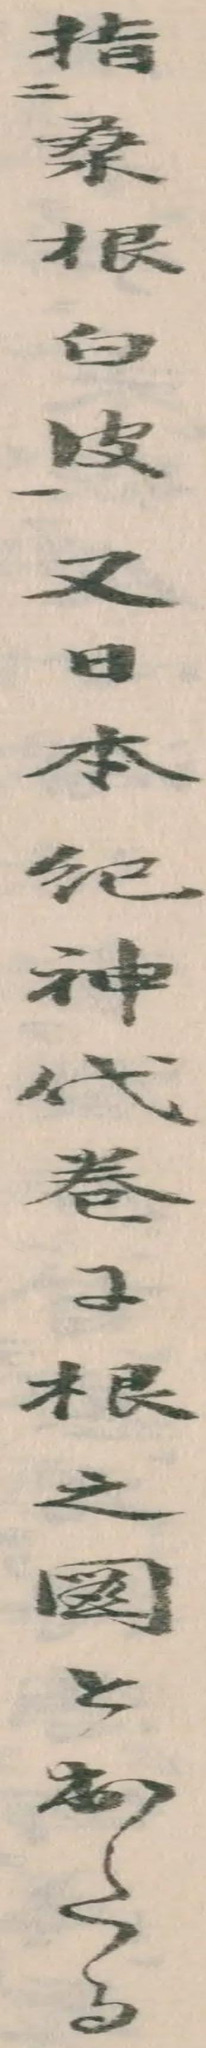指桑根白皮又日本紀神代巻に根之国と出たる
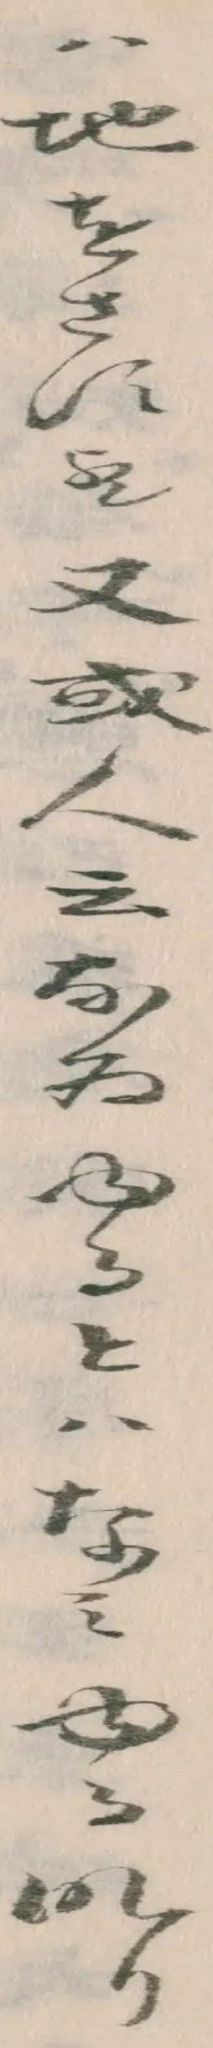は地をさす歟又或人云なゐゆるとはなみゆるなり

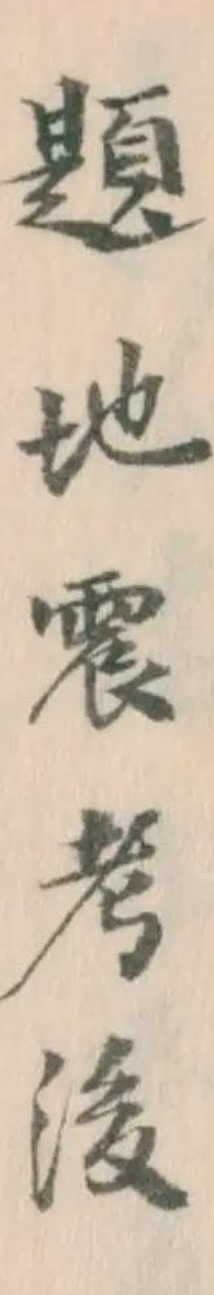題地震考後
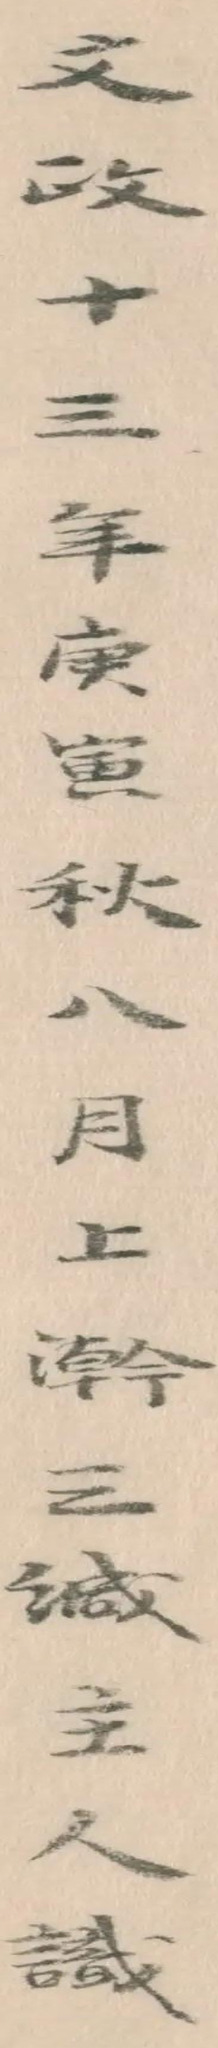文政十三年庚寅秋八月上瀚三緘主人識
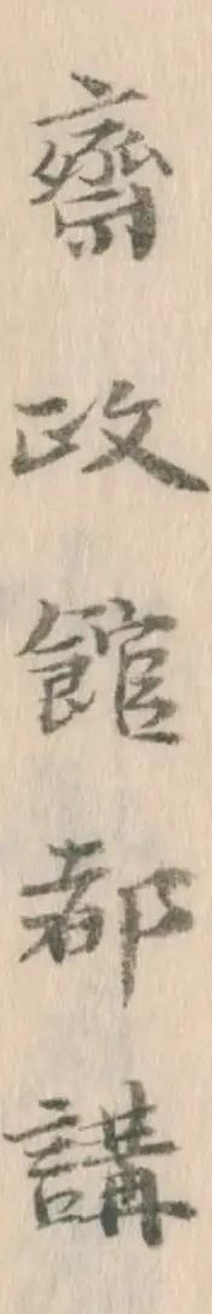斉政館都講

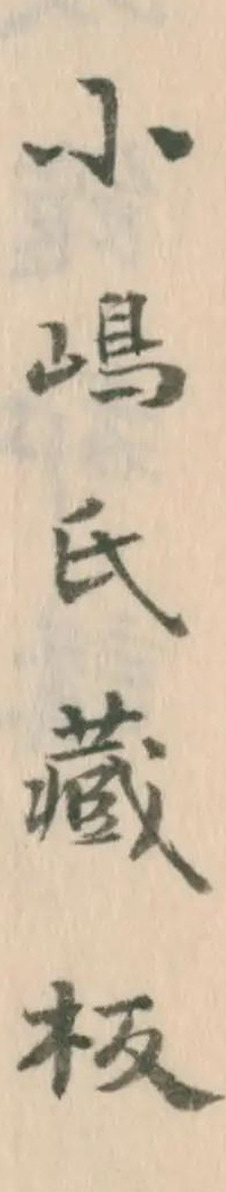小嶋氏藏板
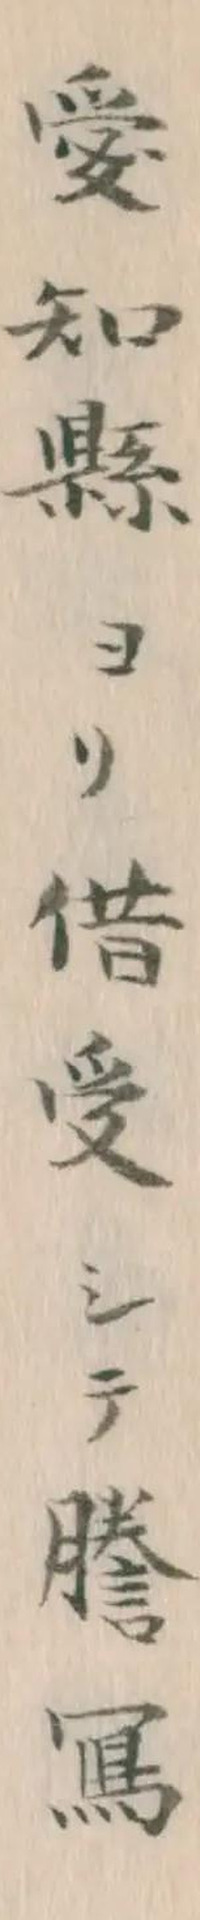愛知県ヨリ借受シテ謄写
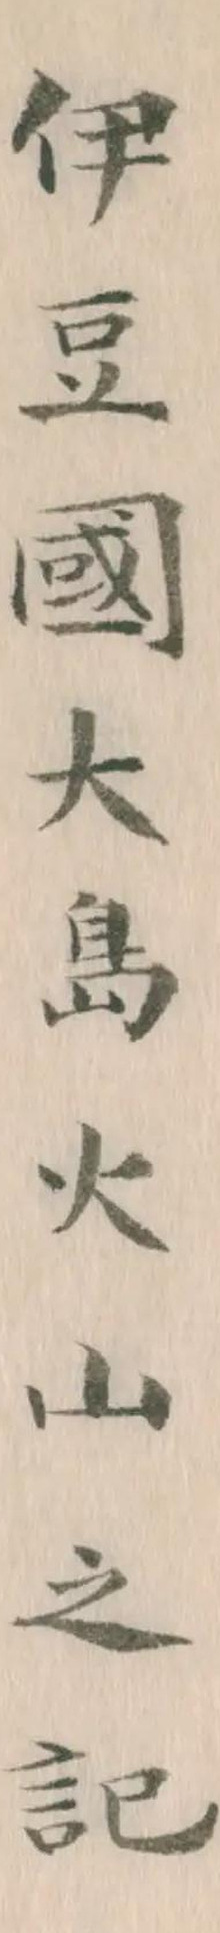伊豆国大島火山之記

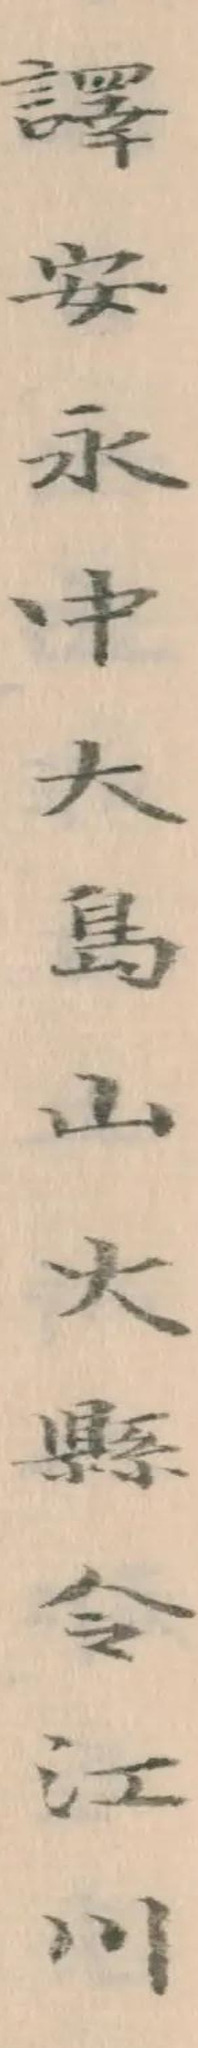訳安永中大島山火県令江川
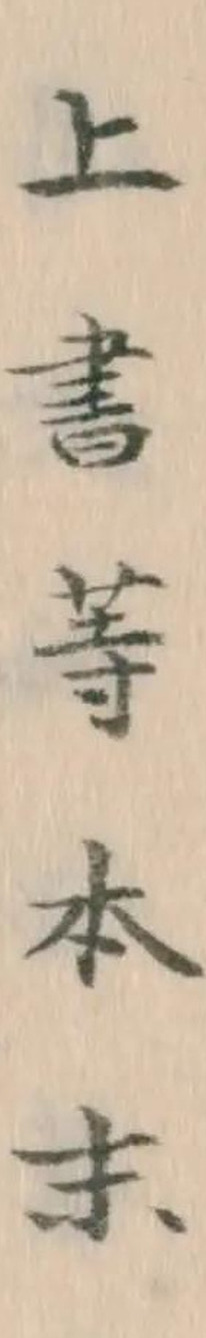上書等本末
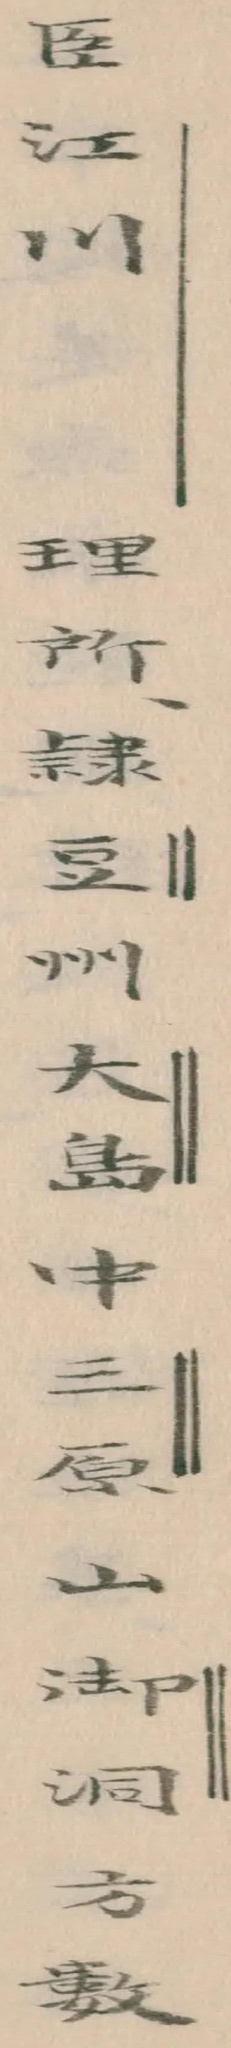臣江川理所、隷豆州大島中三原山御洞方数
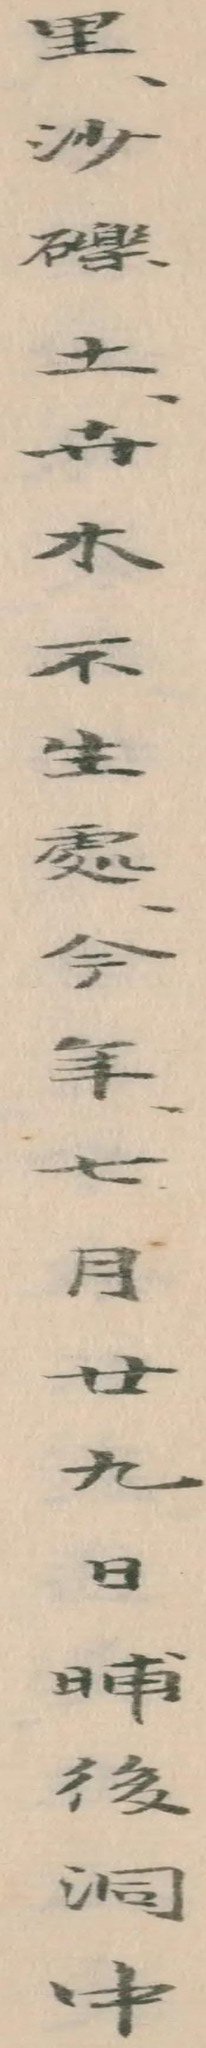里、沙礫土、卉木不生処、今年、七月廿九日晡後洞中
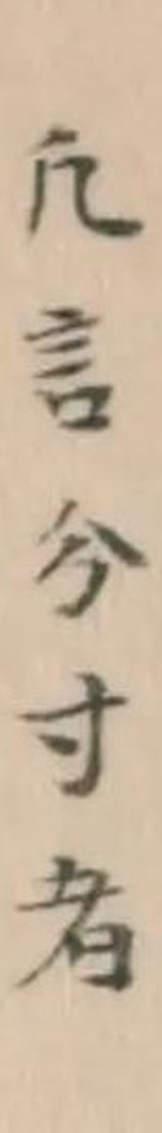凡言分寸者
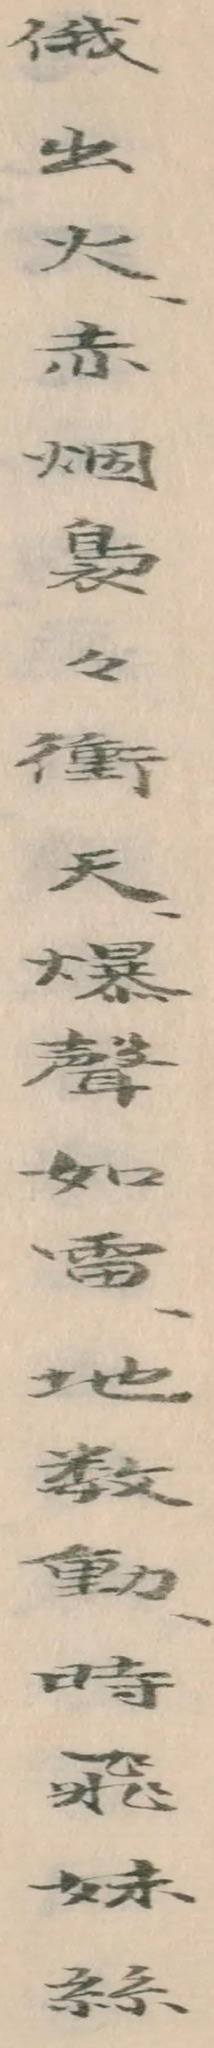俄出火、赤烟裊々衝天、爆声如雷、地数動、時飛妹絲
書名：地災撮要. 巻11-12(地震之部)
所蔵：国立国会図書館 National Diet Library, JAPAN
